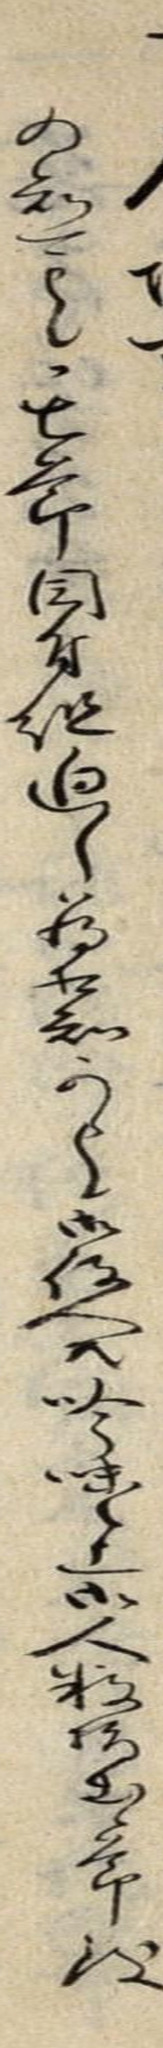為知可申候其節目付組廻し為相知可申候御役人共吟味之上御人数指出候節致
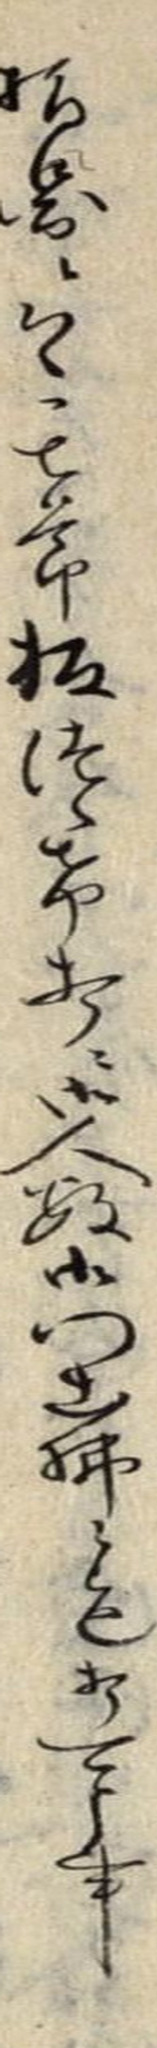指図候はゝ其節板つゝけ打に御人数御門出払候まで打可申事
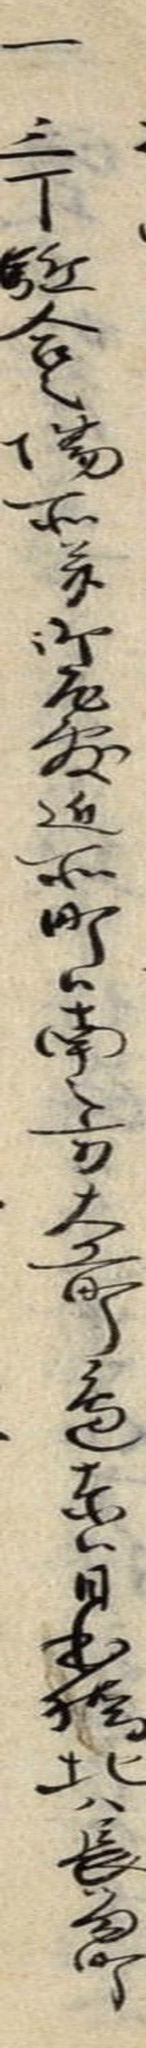一三丁駆合之場所并御屋敷近所町は南之方大工町辺東は日本橋北は長多町
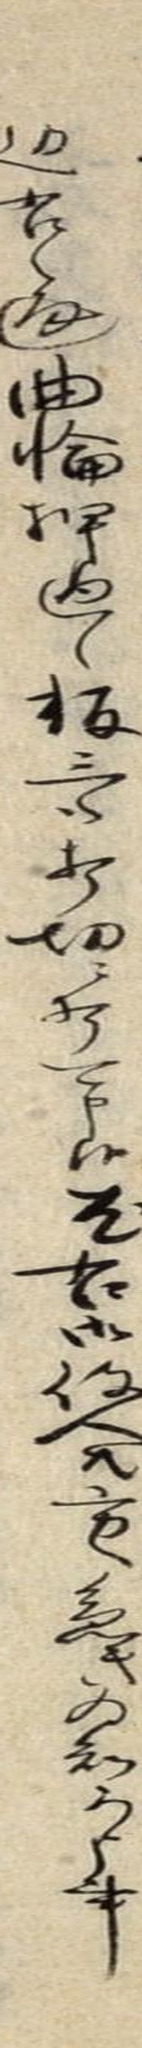辺右之通曲輪押通し板三つ打切に打可申候尤右御役人共方へ急き為知可申事
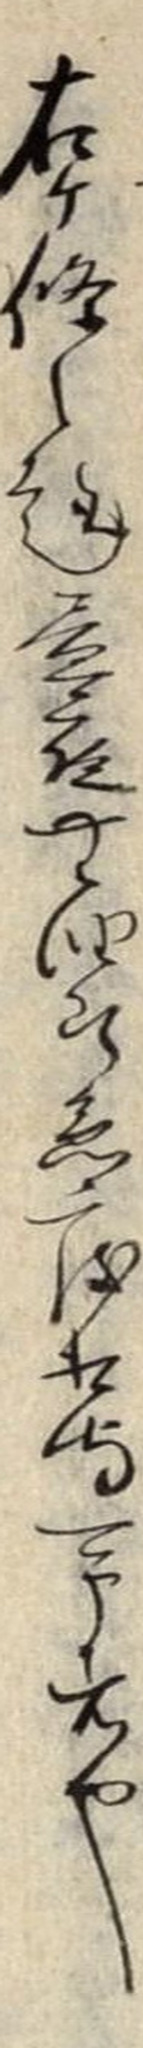右ケ條之趣昼夜無油断急度相守可申者也
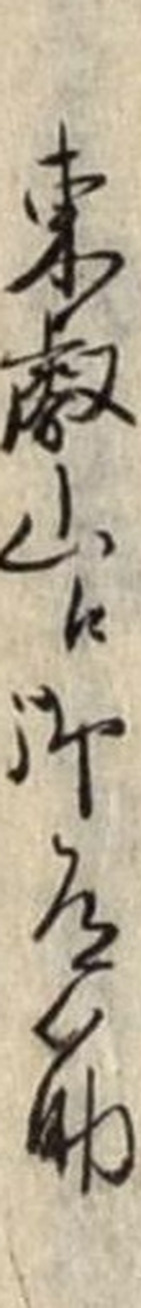東叡山江御道筋
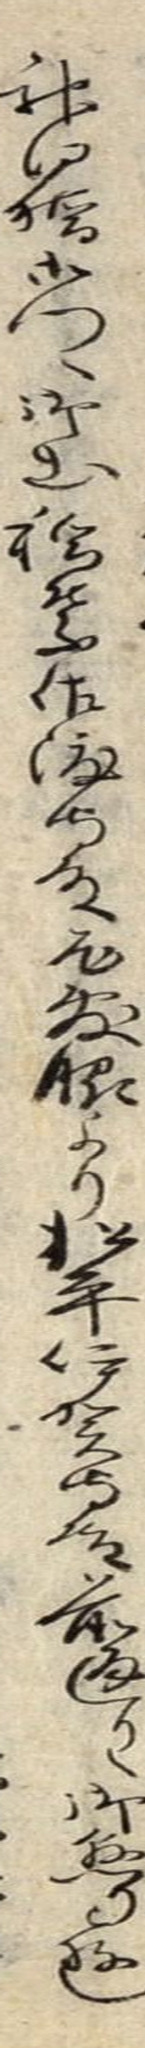神田橋御門へ御出稲葉佐渡守殿屋敷脇より松平伊賀守殿前通りへ御懸り被遊
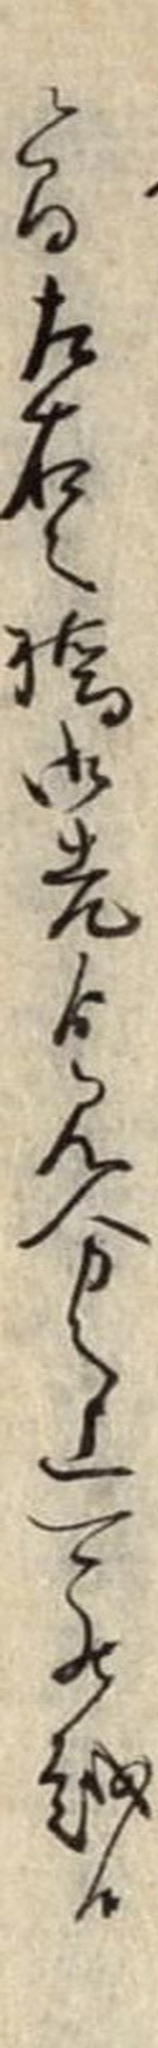候間左右之橋御先ゟ見分之上可罷越候
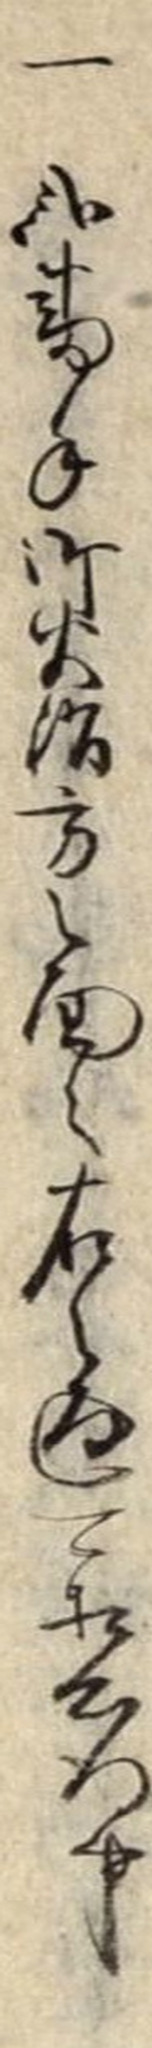一弐番手御火消方之面々右之通可相心得事
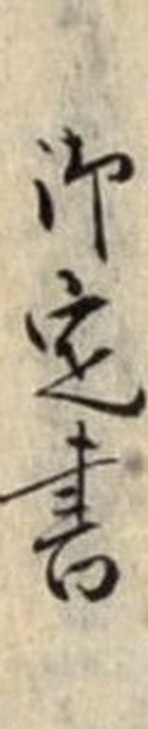御定書
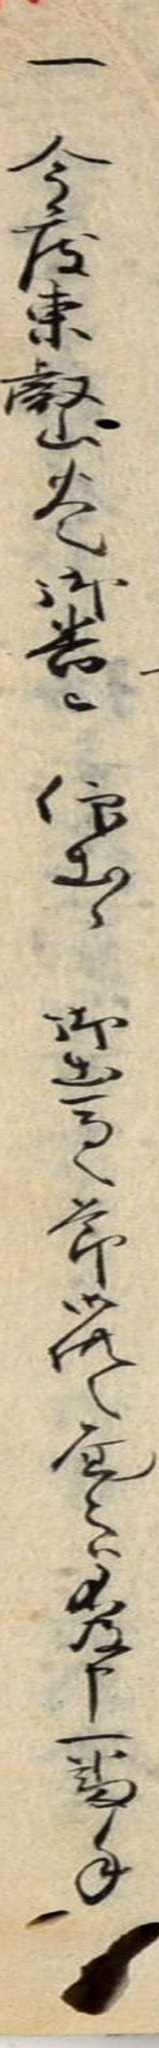一今度東叡山火之御番に被仰出候御出馬之節御供之面々は不及申一番手

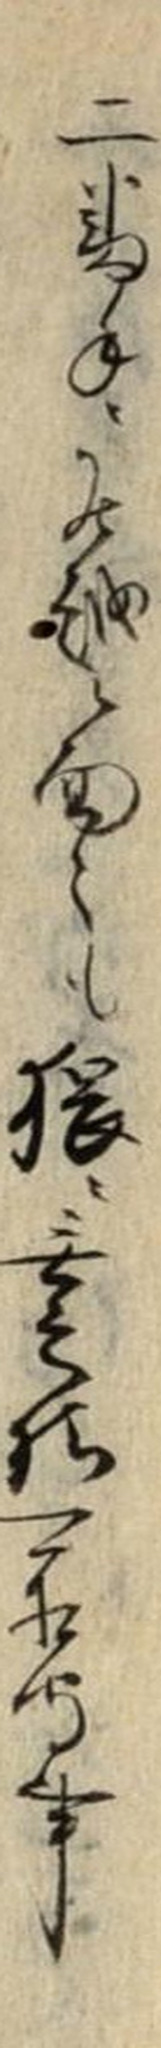二番手に罷越候面々も猥に無之様可相守事
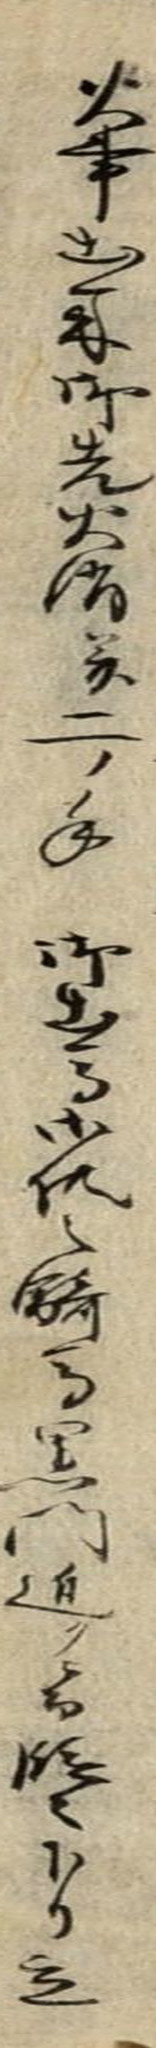一火事出来御先火消并二の手御出馬御供之騎馬黒門近くにて段々下り立
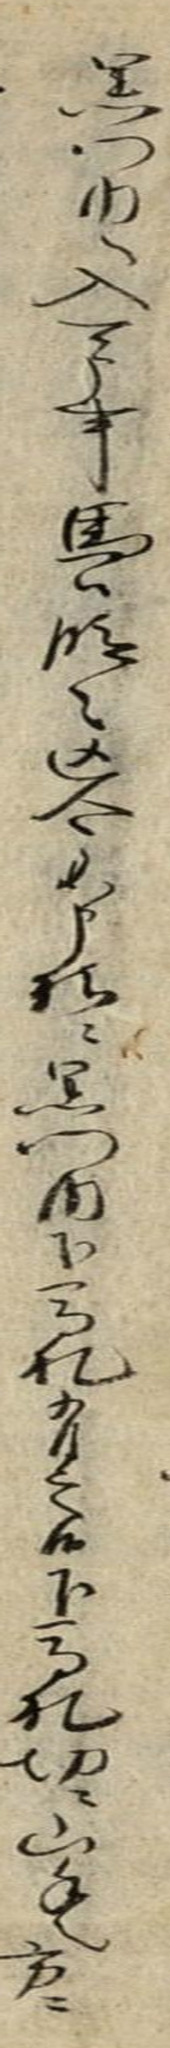黒門内へ入可申事馬は段々込合不申様に黒門内下馬札有之候下馬札切に山手之方に
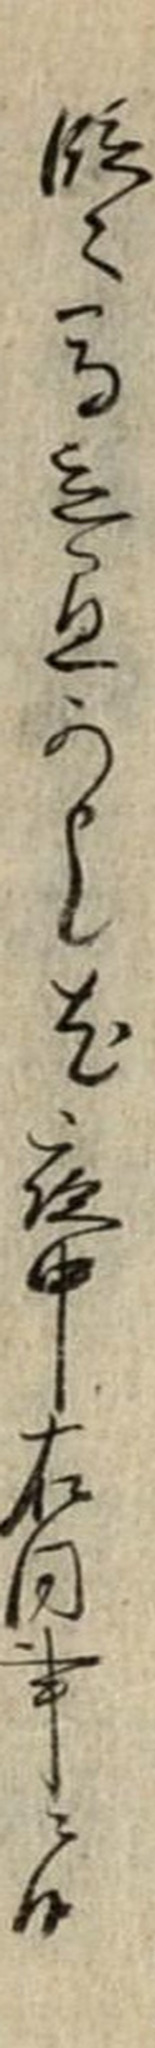段々馬立置可申候尤夜中右同事に候
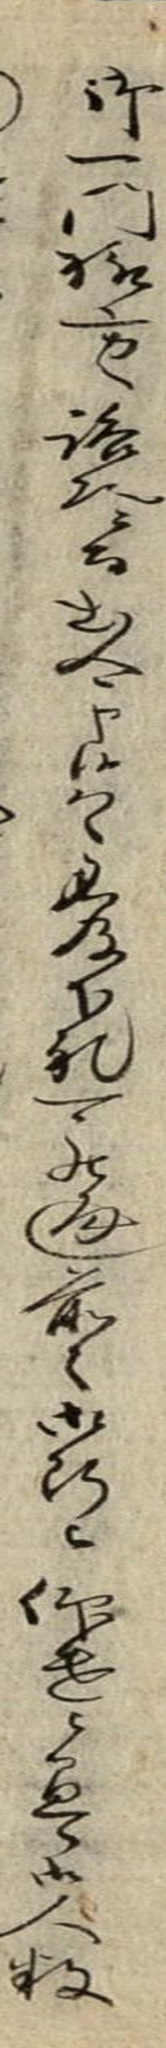一御一門様方へ路次にて出合申候はゝ不及下礼可罷通前々御断被仰遣被置候御人数
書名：三都并道中之部
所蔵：福井県文書館 Fukui Prefectural Archives
